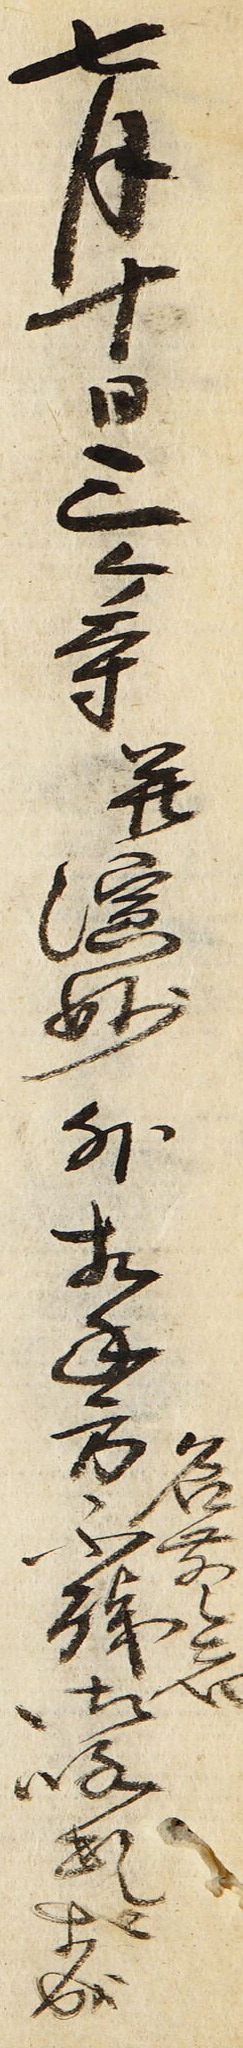七月十日三ケ寺并演妙外相手方不残御呼出しに相成
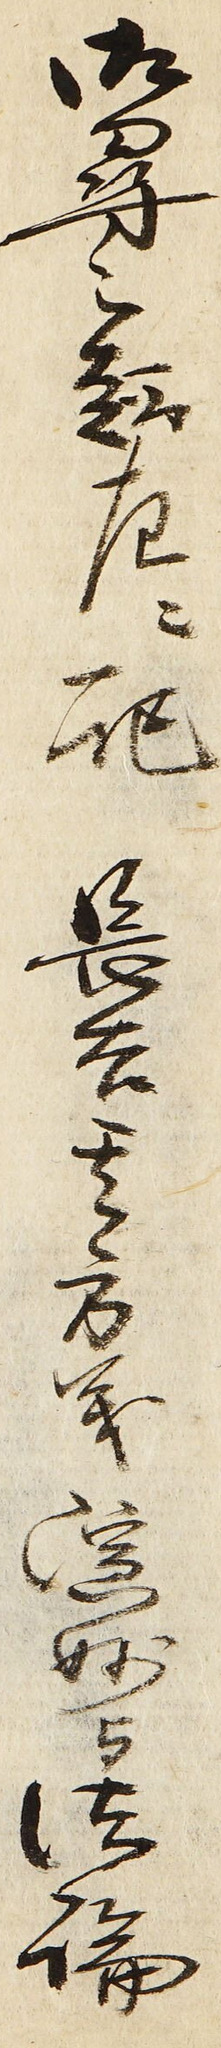御尋之趣左に記長吉其方義演妙と法論
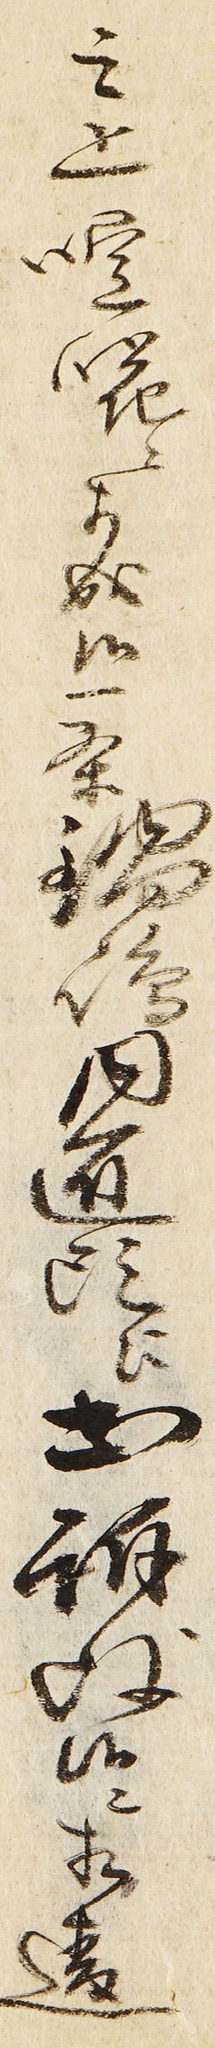之上喧嘩に相成候一条鍋嶋内匠頭江出訴致候に相違
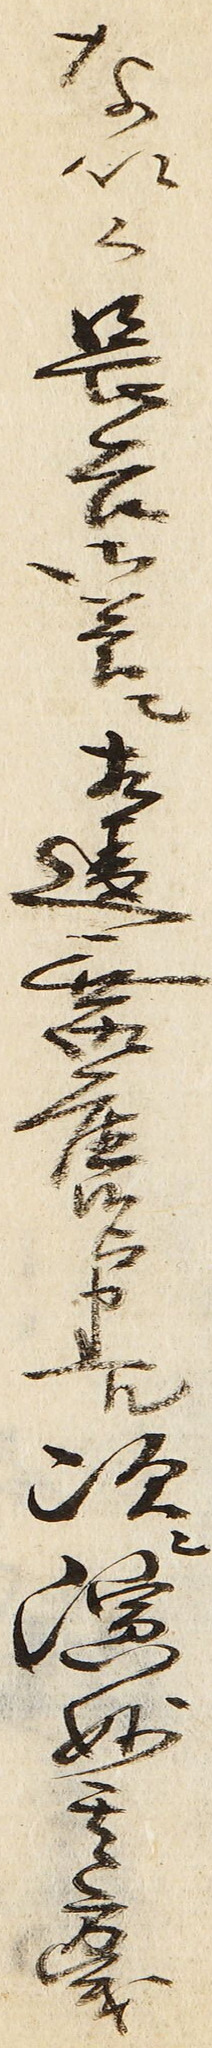ないか長吉御答に相違無御座候と申上ル次に演妙其方義
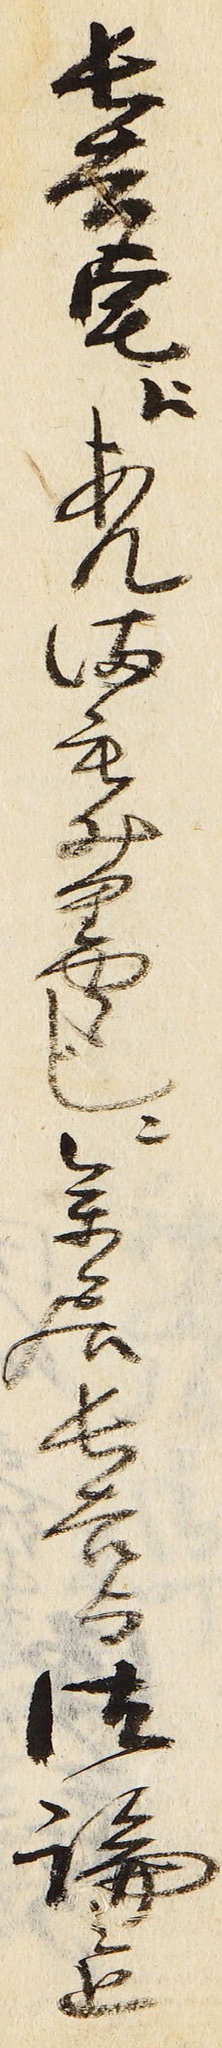長吉宅江あんまもみりやうじに参居長吉と法論之上
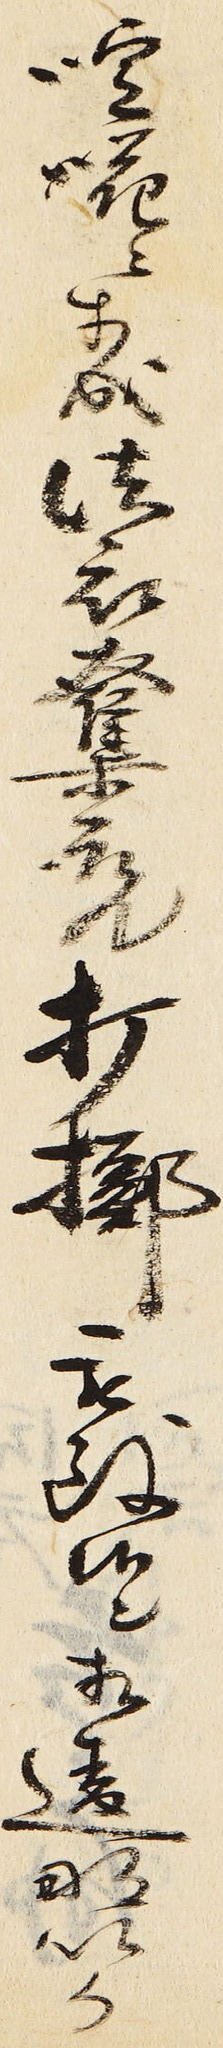喧嘩に相成法衣奪取ル打擲被致候に相違ないか
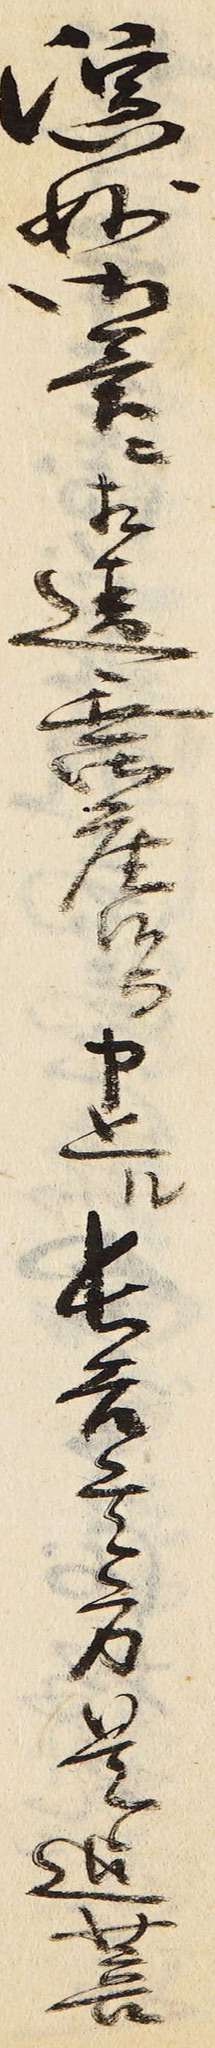演妙御答に相違無御座候と申上ル長吉其方是迄菩
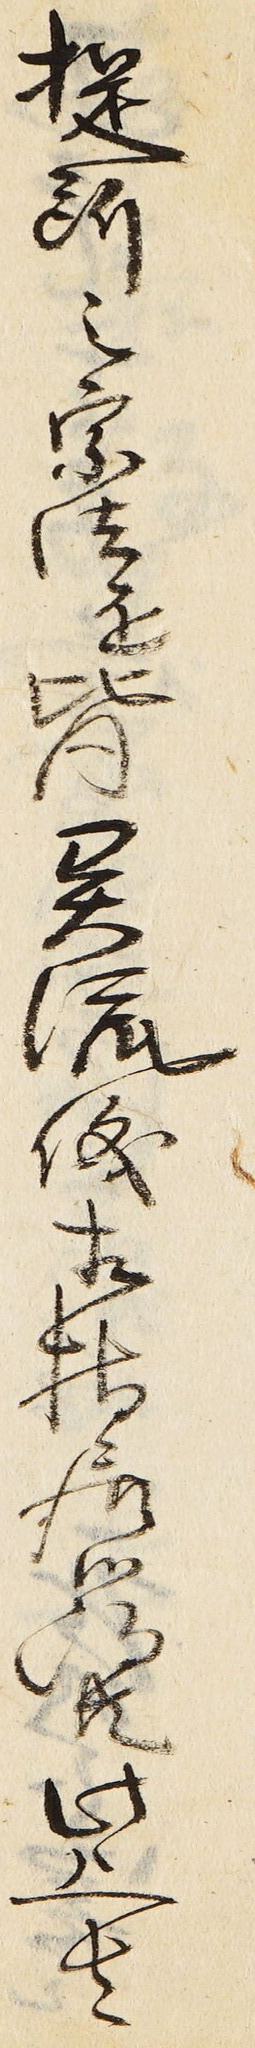提所之宗法を背異流儀相持居候得共此上は
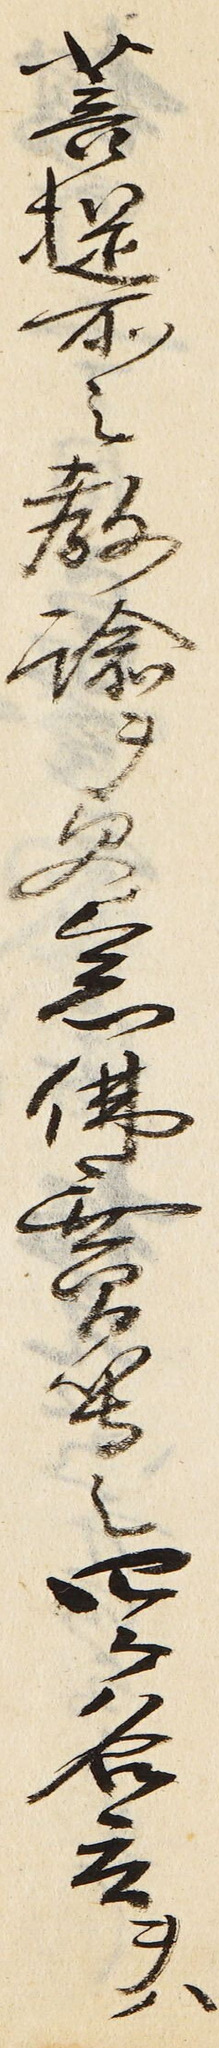菩提所之教諭ヲ受念佛無間等之四ケ名言ヲは
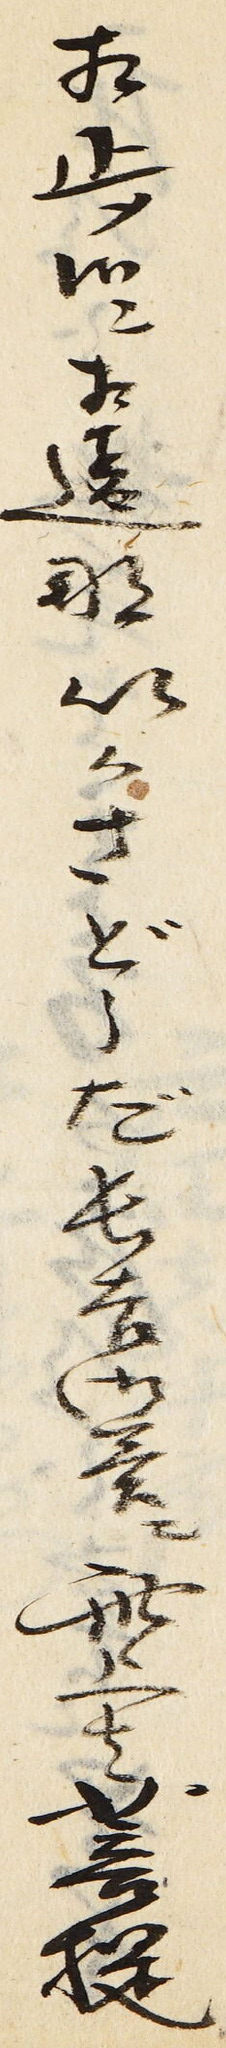相止メ候に相違ないかさどうだ長吉御答に此上は菩提
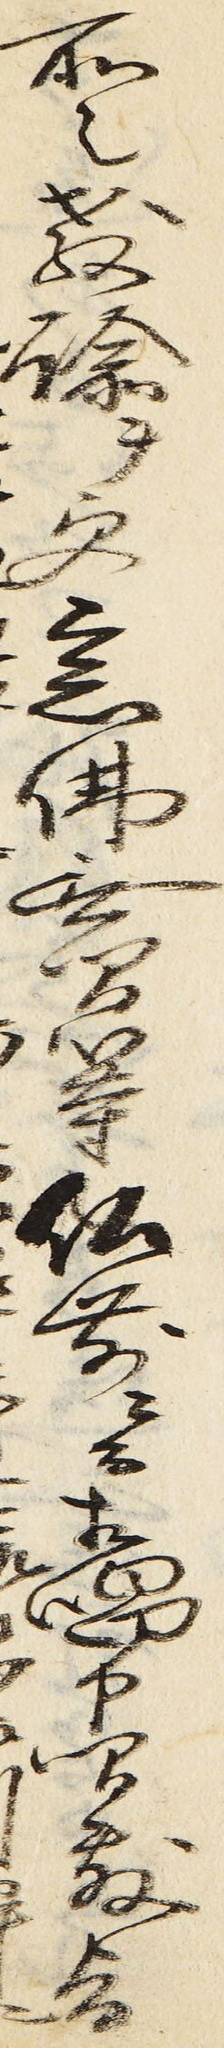所之教諭ヲ受念佛無間等仏前に而相唱申間敷旨
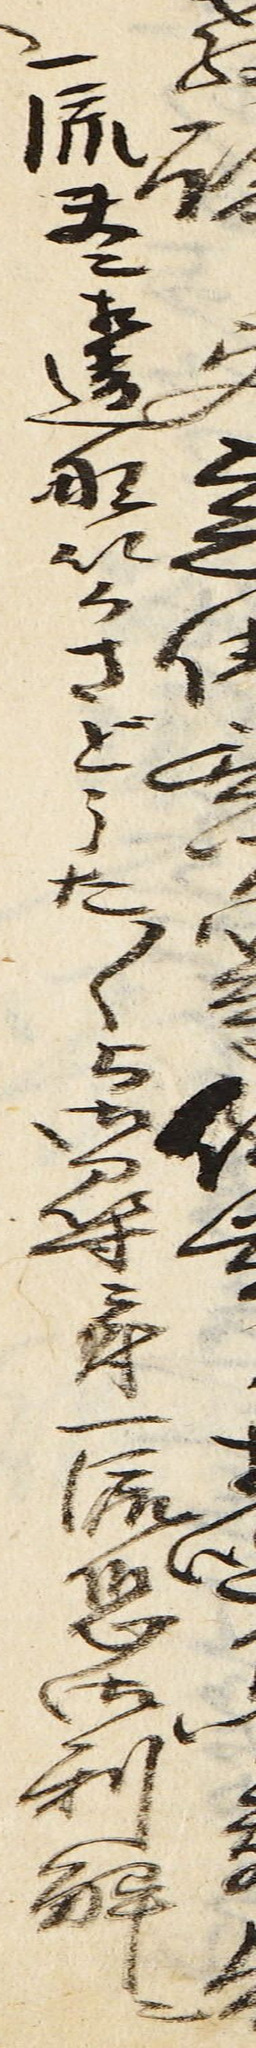一統夫に相違ないかさどうた〳〵と御尋に付一統恐御利解に

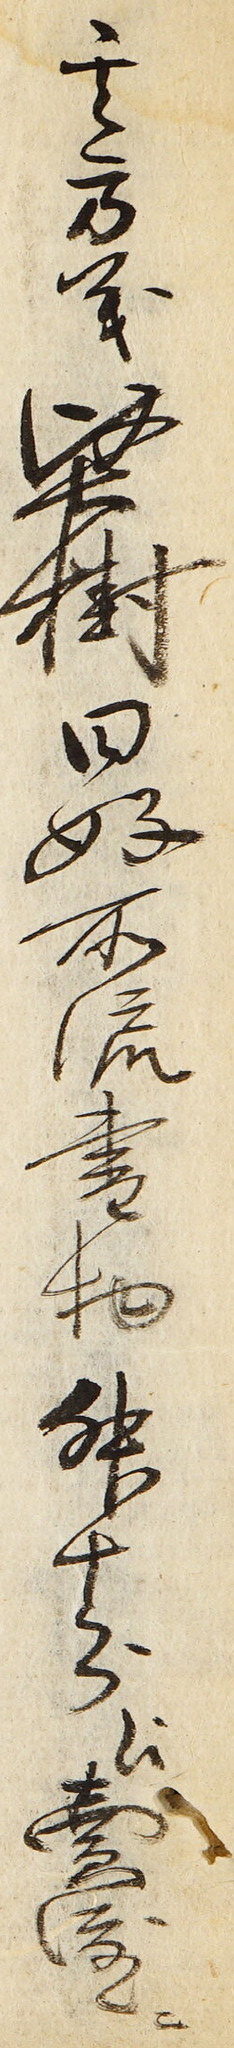其方義堅樹日好所流書物升十郎江売渡候に
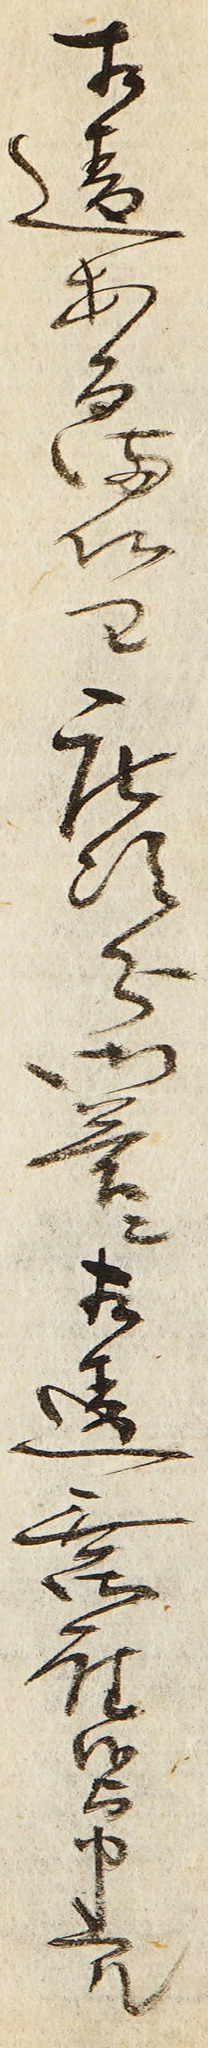相違あるまいわ庄次郎御答に相違無御座候と申上る
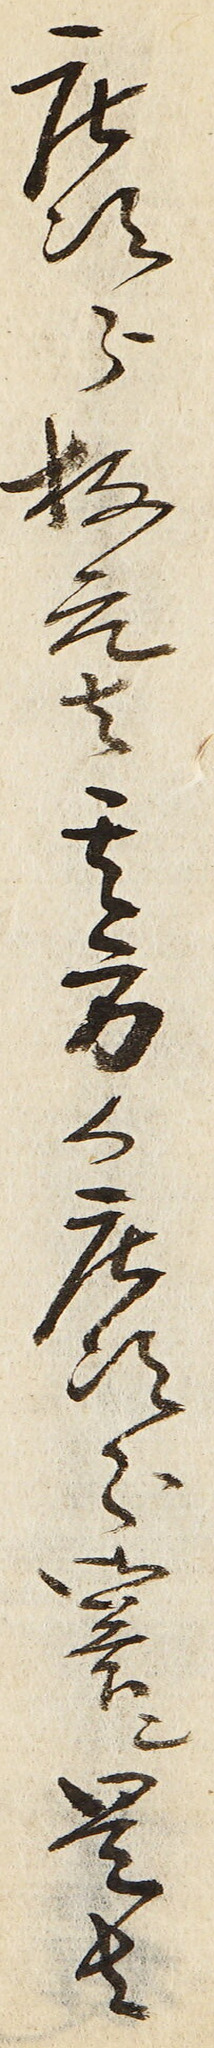庄次郎板元は其方か庄次郎御答に是は
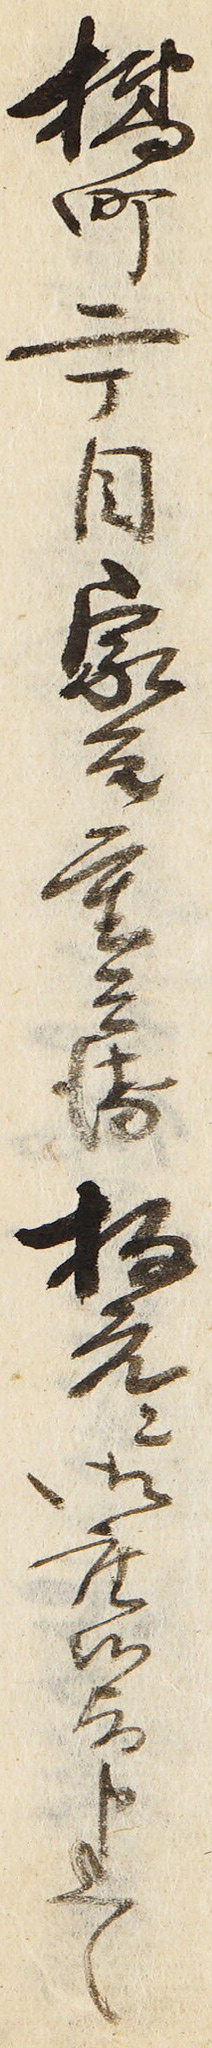橋町二丁目家主重兵衛板元に御座候旨申上候
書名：異流一件日記
